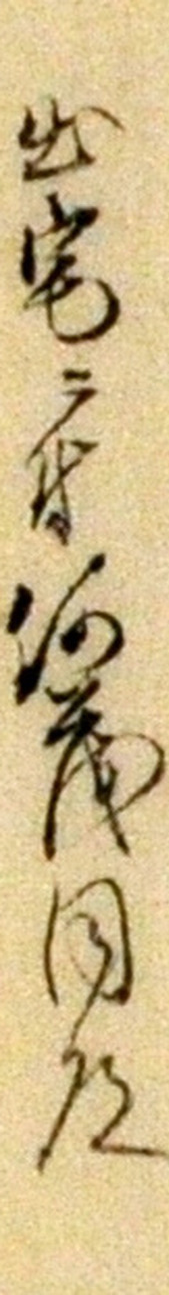出宅二付何も同道
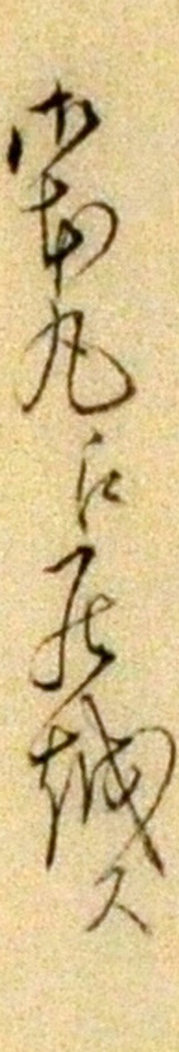御本丸え罷越ス
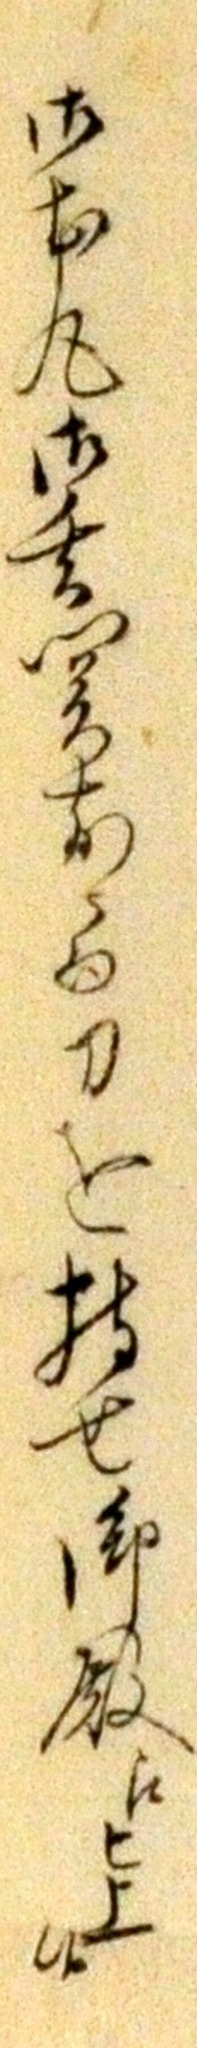御本丸御玄関前ニ而刀を持せ御殿え被上候
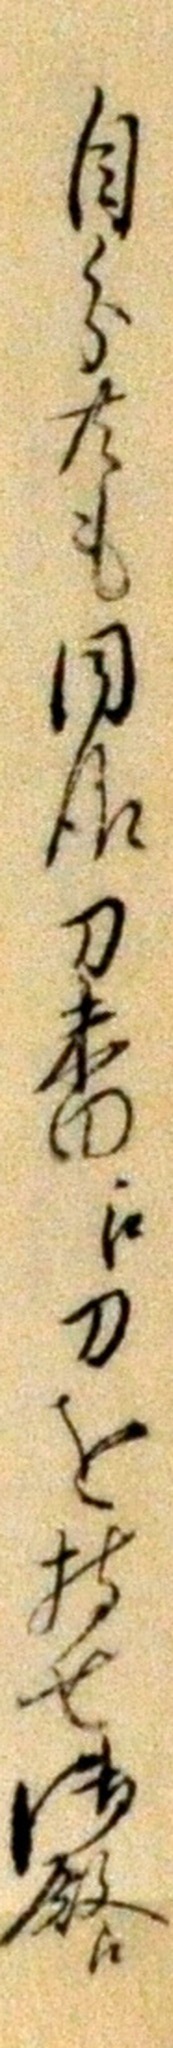自分共も同様刀番え刀を持せ御殿え
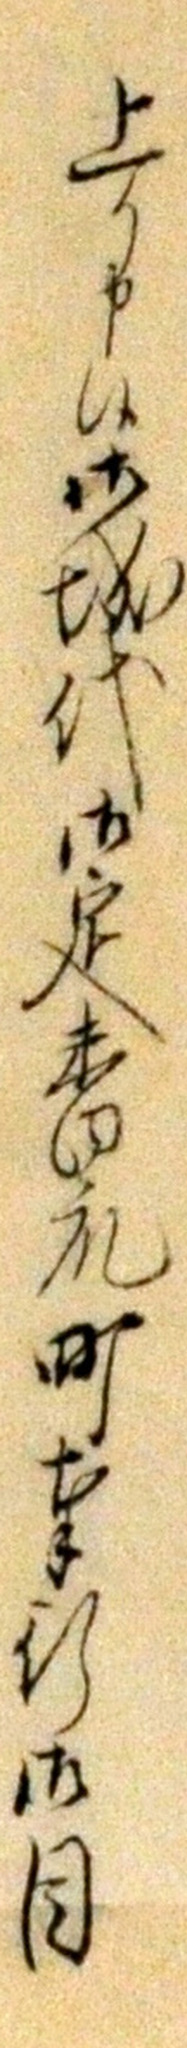上り申候御城代御定番衆町奉行御目
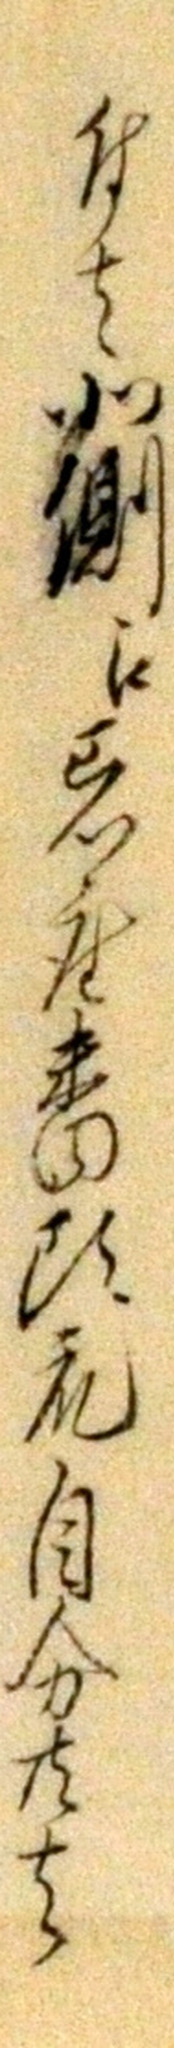付は北側え着座番頭衆自分共は
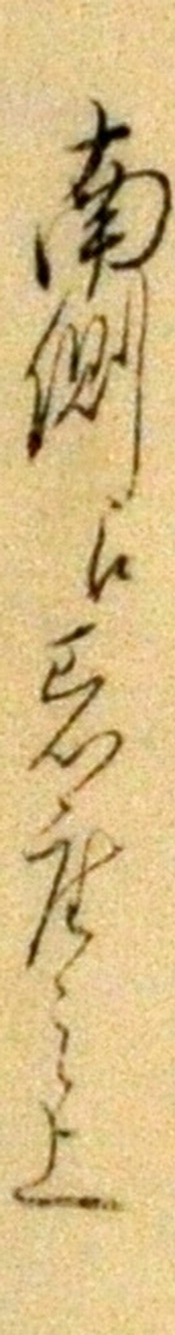南側え着座之上
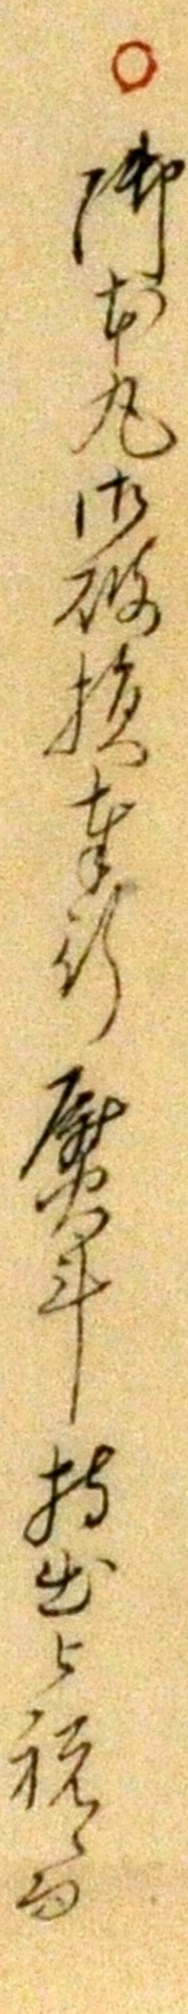御本丸御破損奉行熨斗持出被祝候而
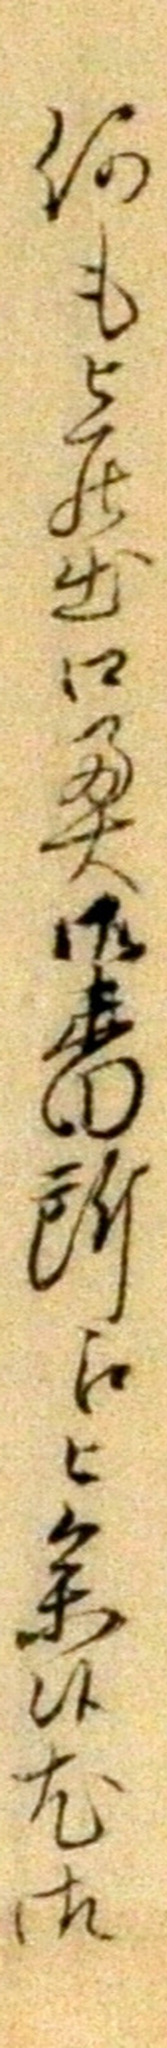何も被罷出口奥御番所え被参候尤御
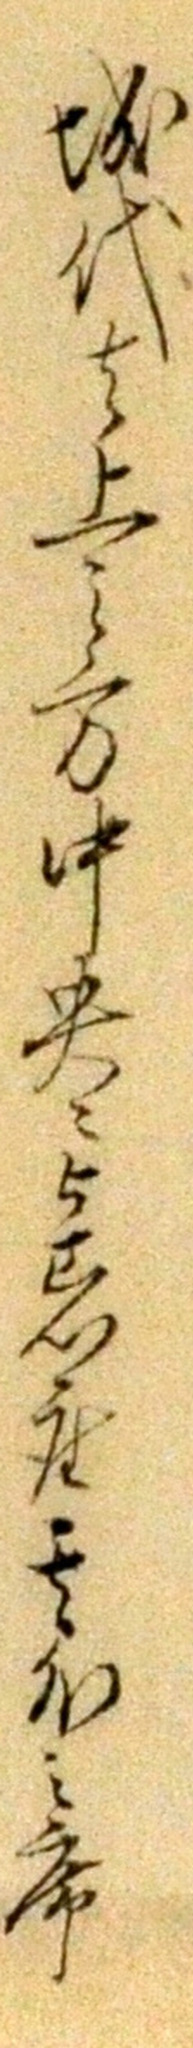城代は上之方中央ニ被着座其外之席
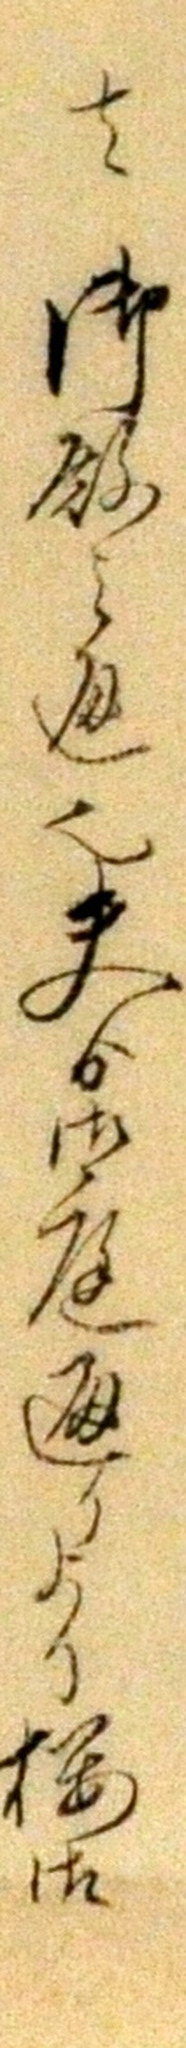は御殿之通也夫ゟ御庭通りより楼御
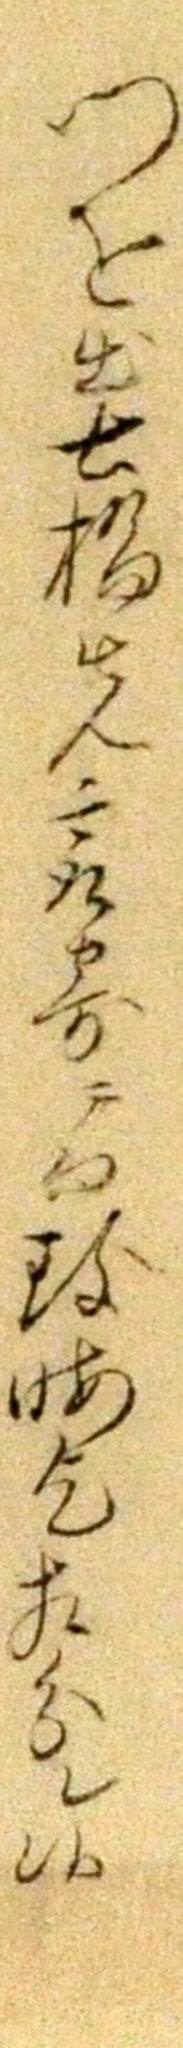門を出土橋先最寄ニ而致暇乞相分レ候
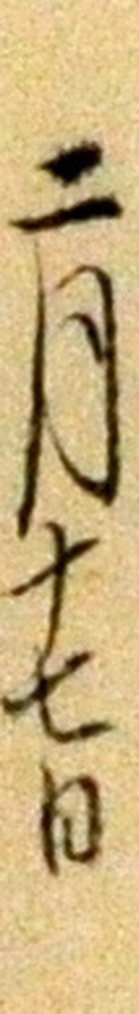二月十七日
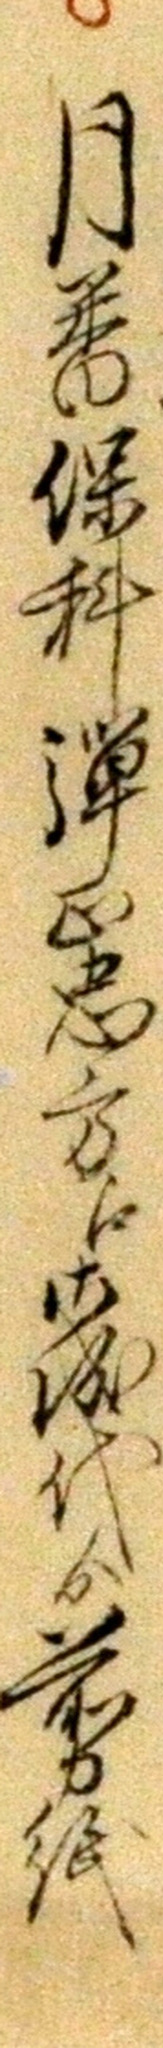月番保科弾正忠方え御城代ゟ剪紙
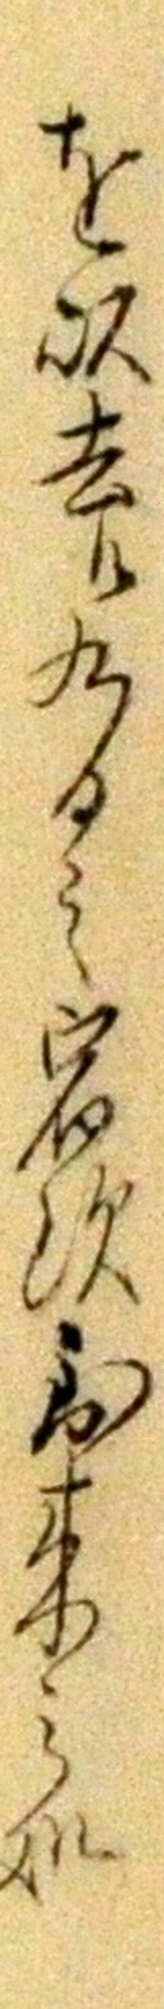を以去ル九日之宿次到来之処
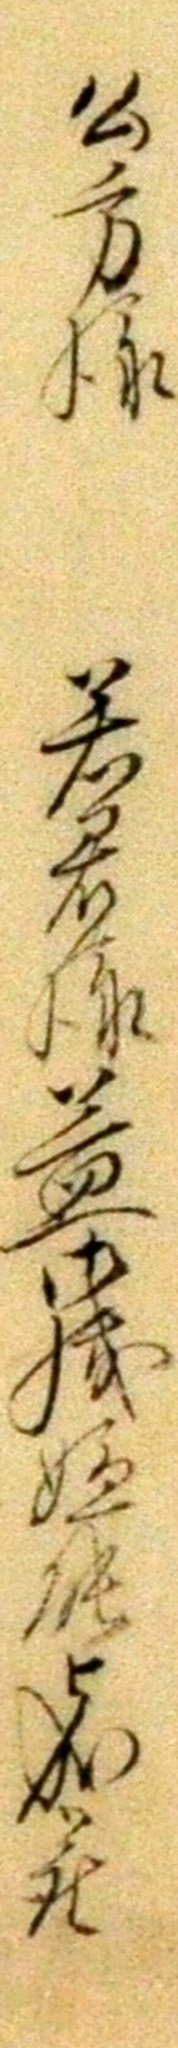公方様若君様益御機嫌能被成御座
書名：大阪加番関係諸書留〔一括〕
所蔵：伊那市立高遠町図書館・合同会社AMANE
